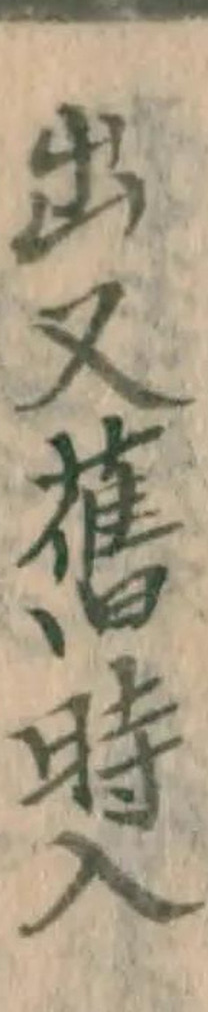出又𦾔時入
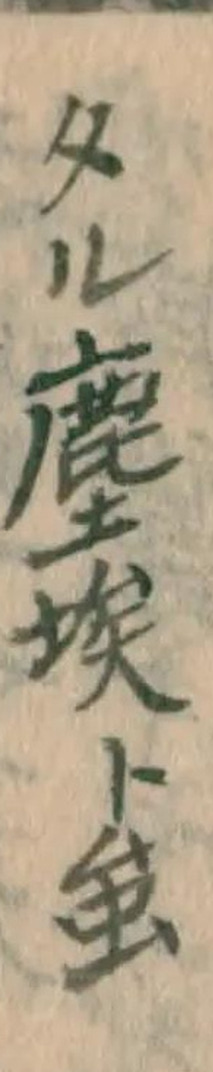タル塵埃ト虽
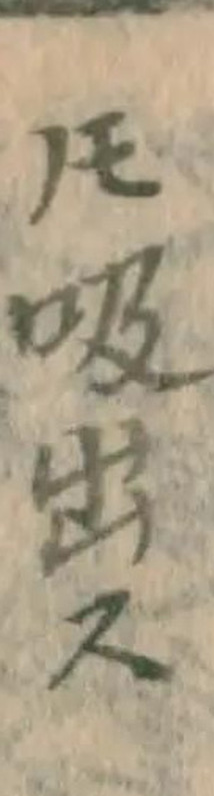トモ吸出ス
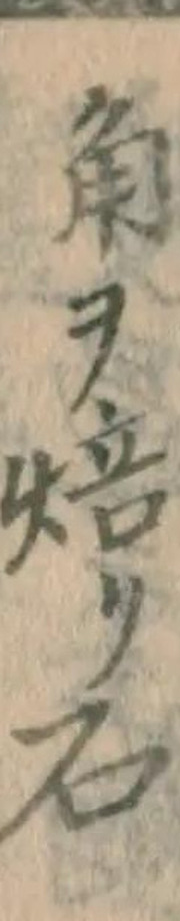角ヲ焙リ石
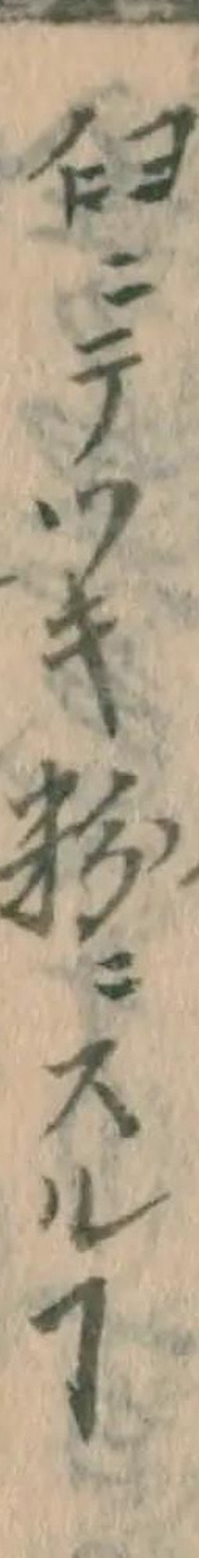臼ニテツキ粉ニスルコト
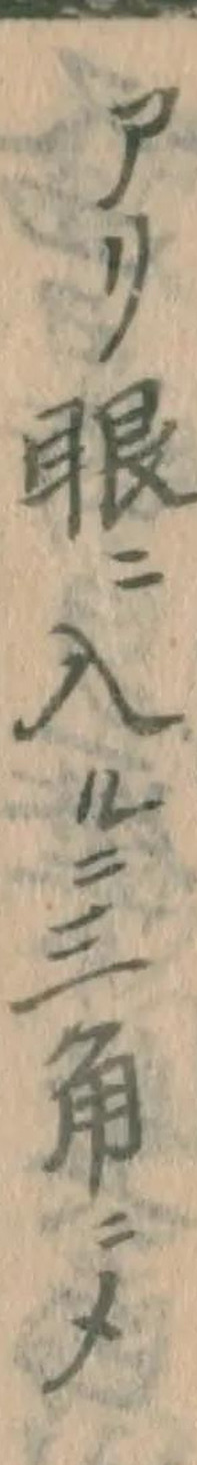アリ眼ニ入ルニ三角ニシテ
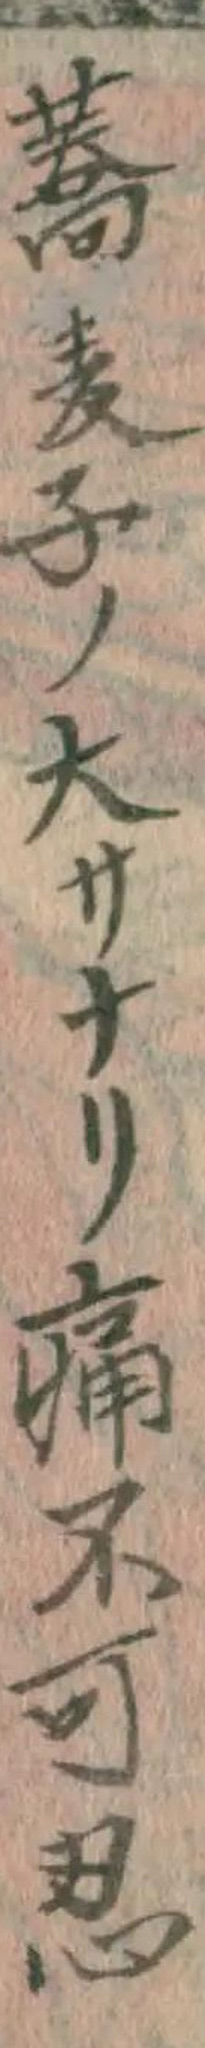蕎麦子ノ大サナリ痛不可忍
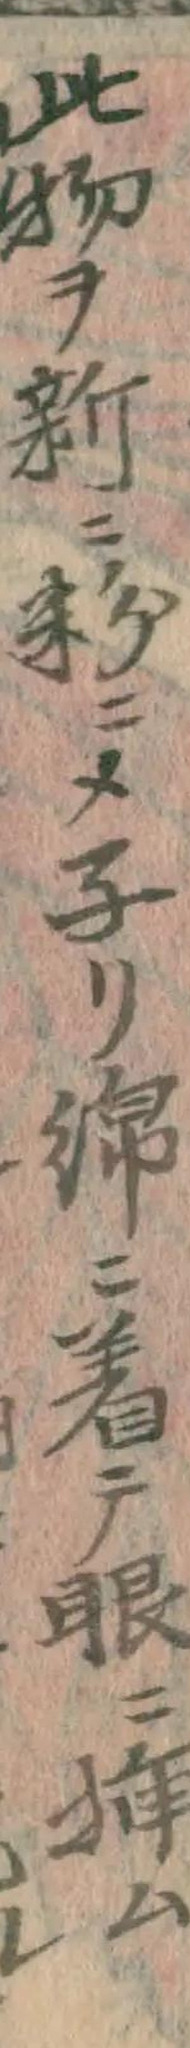此物ヲ新ニ粉ニシテネリ綿ニ着テ眼ニ挿ム
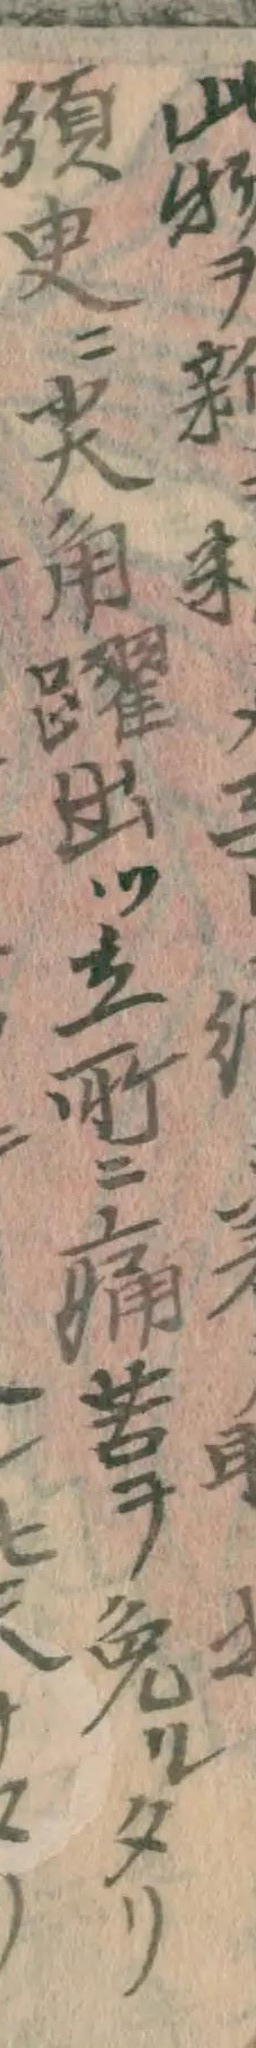須曳ニ尖角躍出ツ立所ニ痛苦ヲ免ルタリ
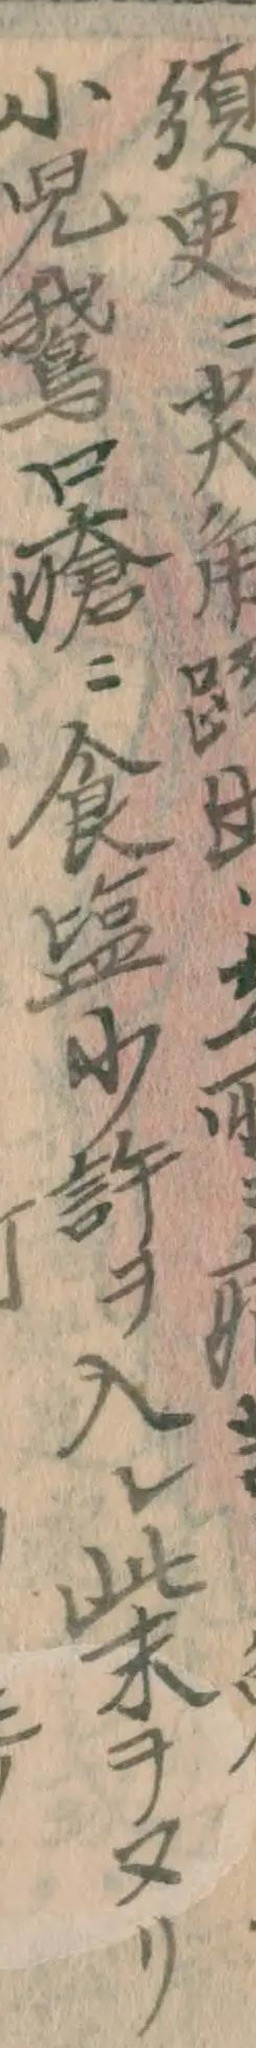小児鵞口瘡ニ食塩少許ヲ入レ此末ヲヌリ
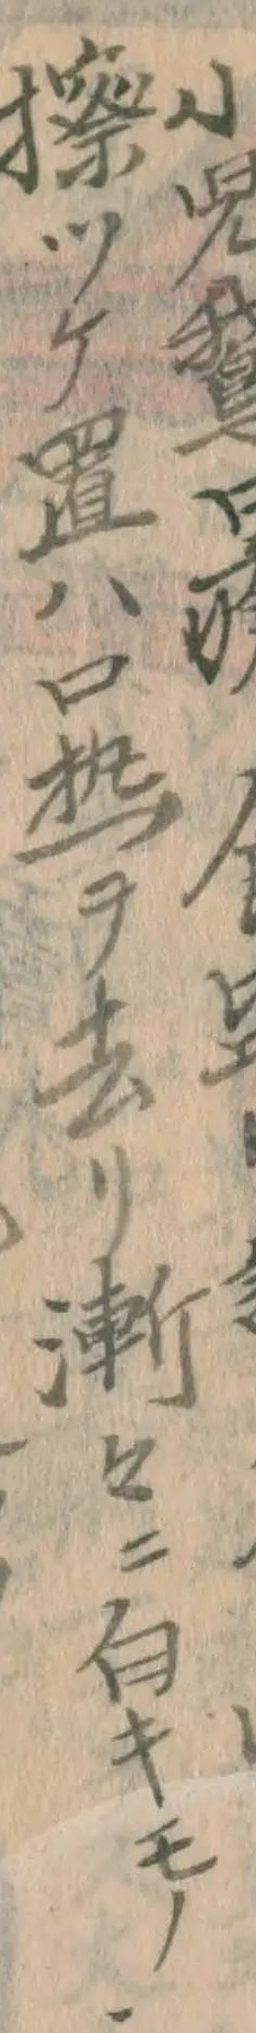擦ツケ置ハ口熱ヲ去リ漸々ニ白キモノ
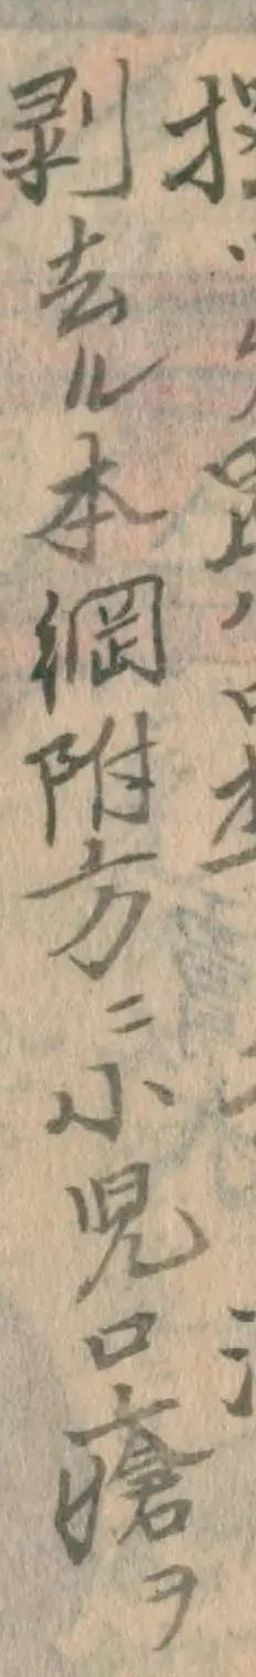剥去ル本綱附方ニ小児口瘡ヲ
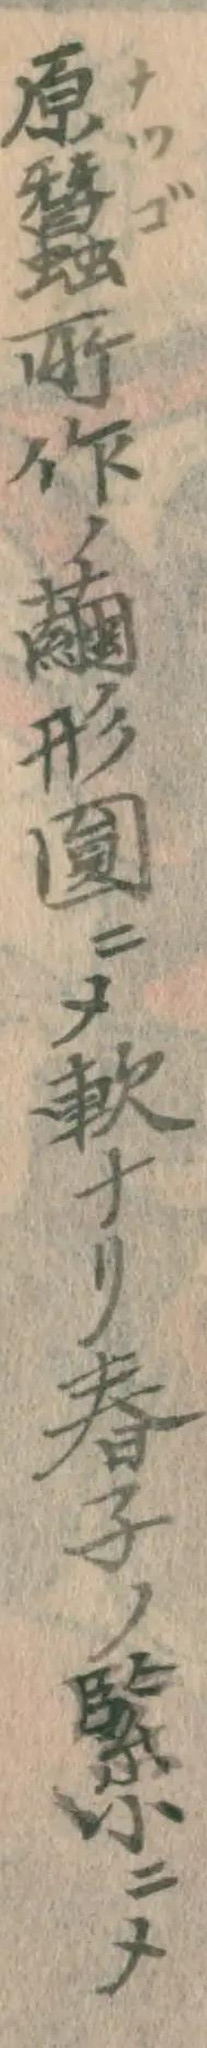原蠶所作ノ繭形圓ニシテ軟ナリ春子ノ緊小ニシテ
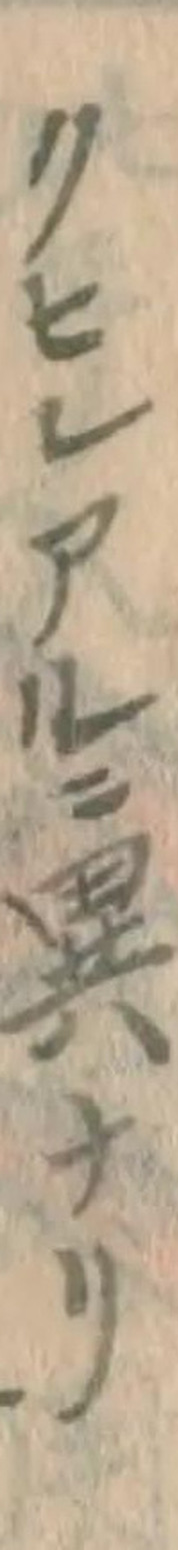クヒレアルニ異ナリ
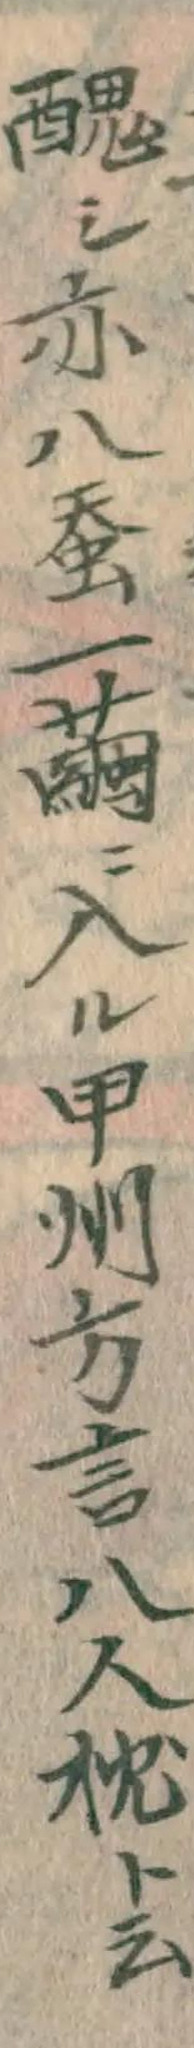醜シ亦八蚕一繭ニ入ル甲州方言八人枕ト云

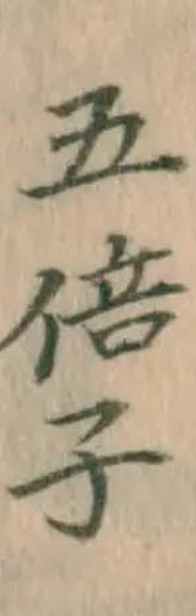五倍子
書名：千蟲譜 3巻. [1]
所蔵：国立国会図書館 National Diet Library, JAPAN
